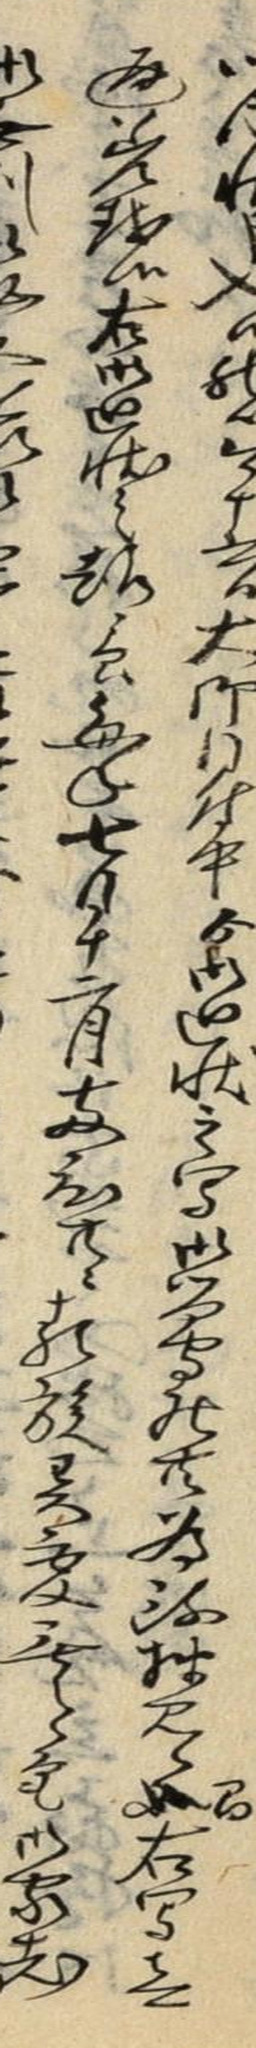通差越候右御廻状之趣にては毎年七月十二月両度共に類族異変無之候ても御家老中
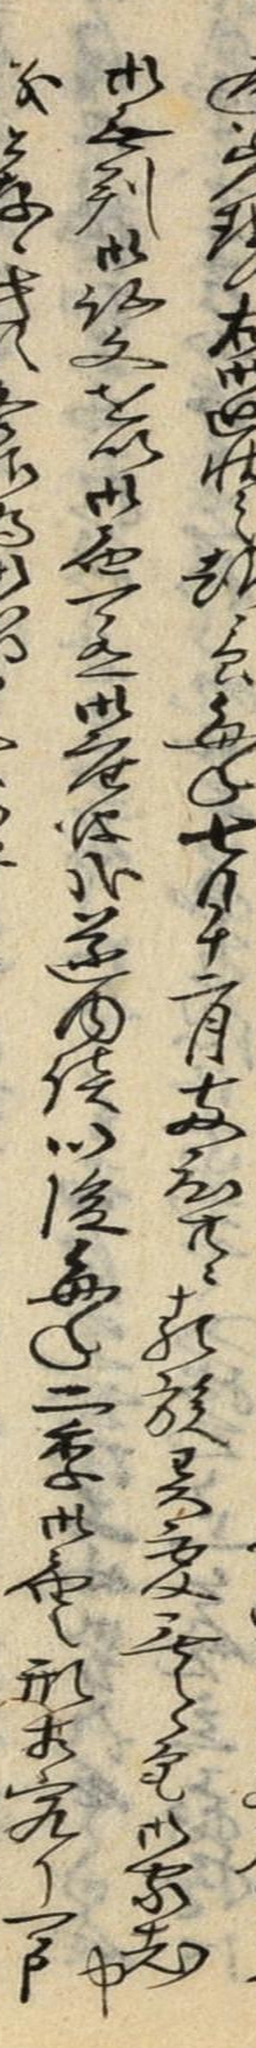御無判御証文を以御届可有御座儀哉遂内談以後毎年二季御届之形相究り可申
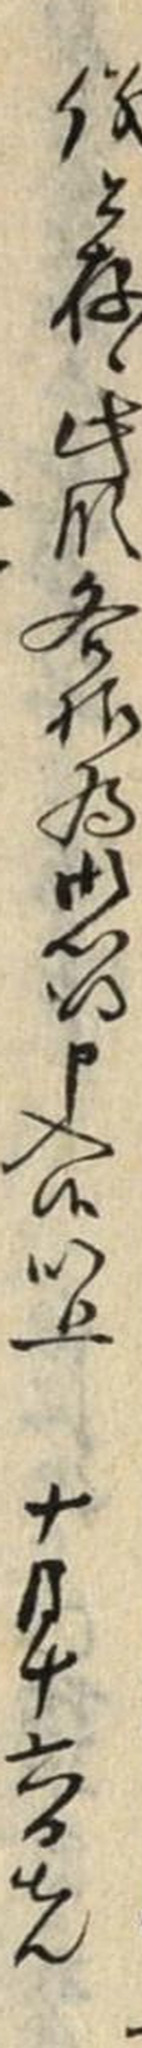儀と存候此段各様為御心得申入候以上十月十六日出ル
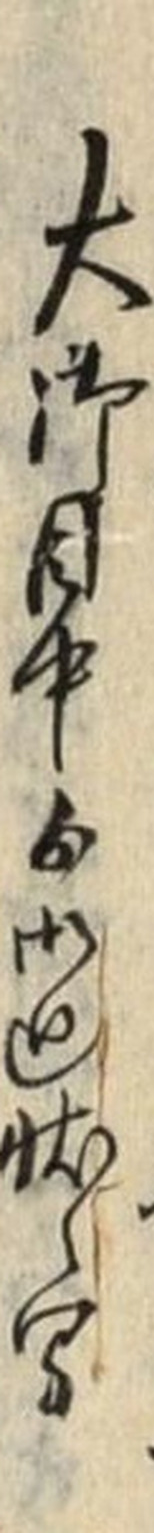大御目中ゟ御廻状之写
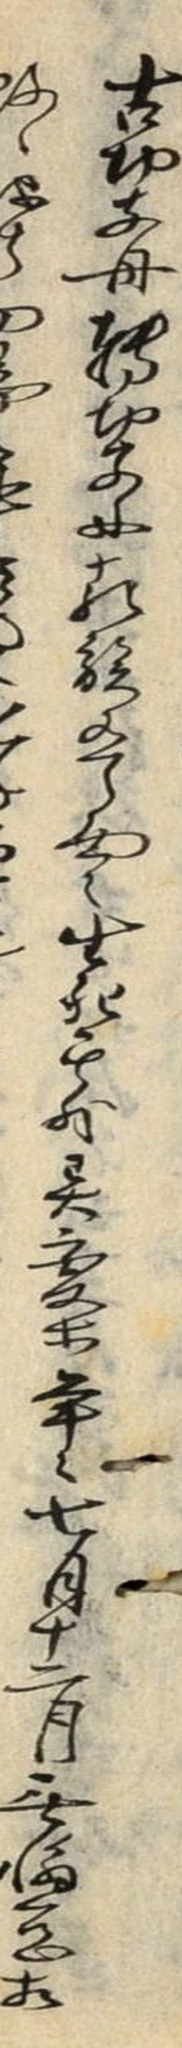古切支丹転切支丹類族有之面々生死其外異変等年々七月十二月無懈怠相
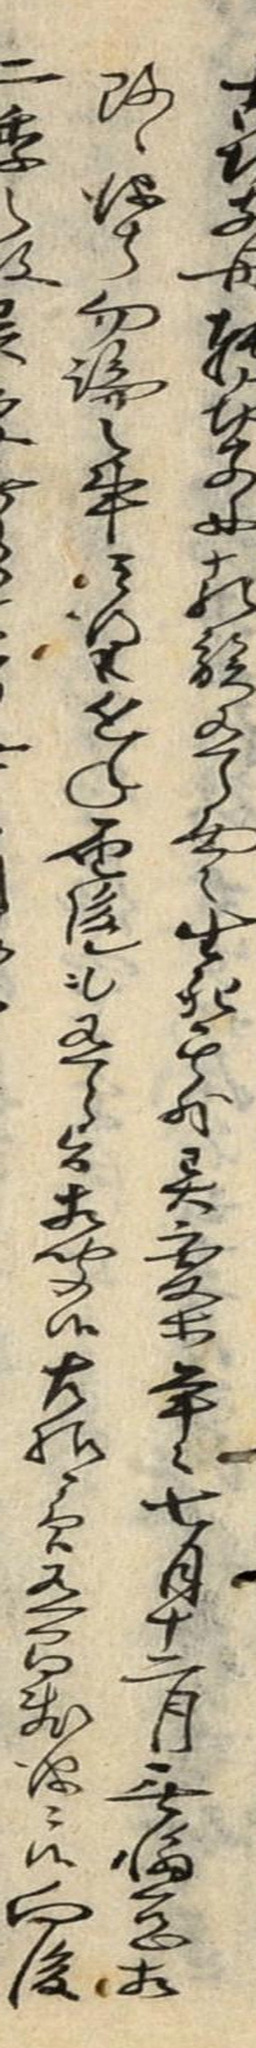改候儀は勿論之事に候得共近年届後レも有之旨相聞候左様にては有間敷儀に候向後
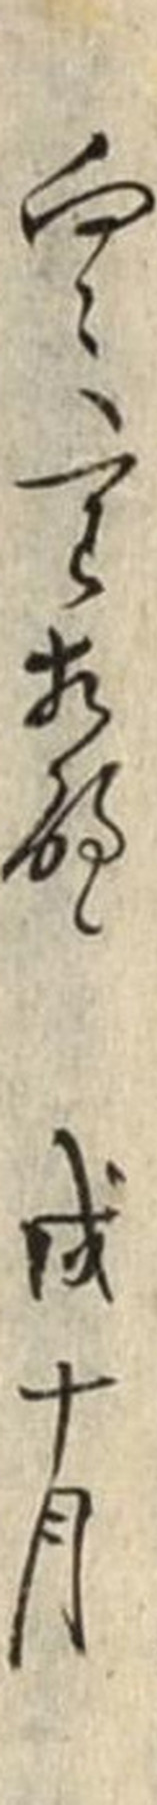向々へ可被相触候戌十月
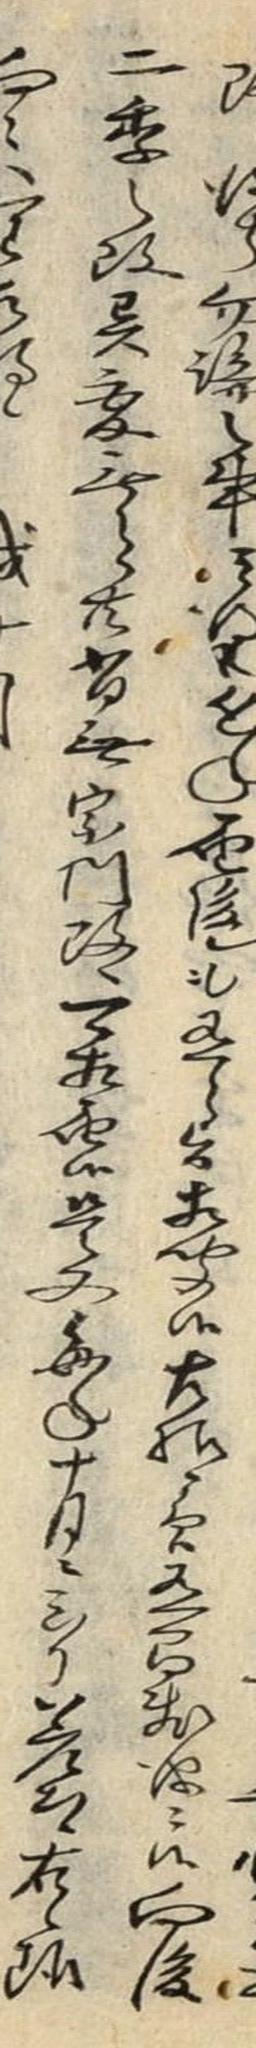二季之改異変無之候共有無宗門改へ可相届候是又毎年十月に至り差出候右之趣
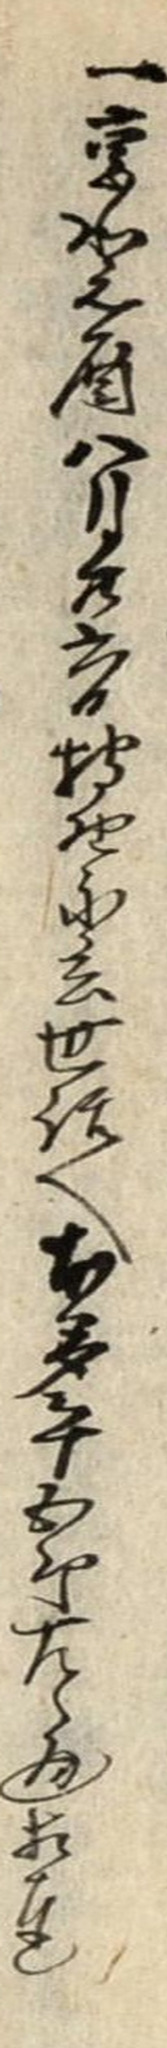一享和元酉八月廿六日狩野永玄世話人本多平五郎左之通相達
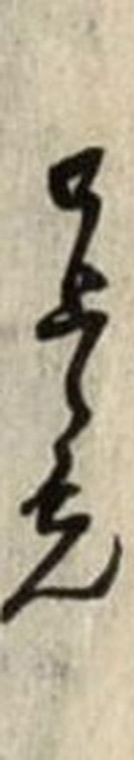口上之覚
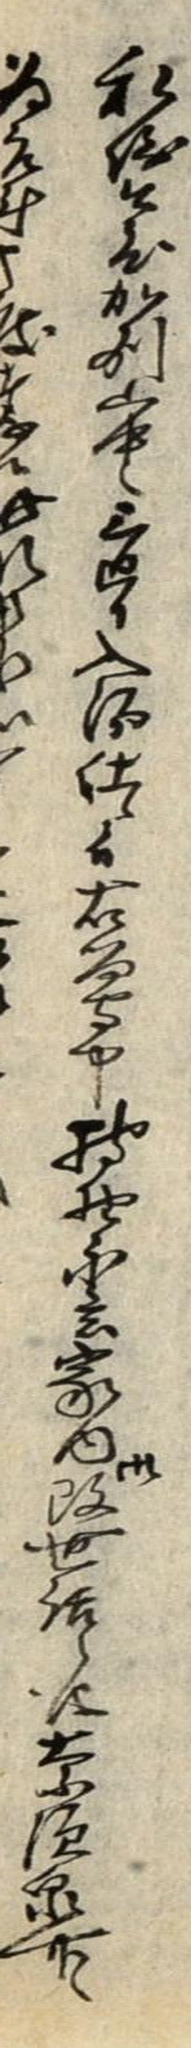私儀今度加州山中へ三廻り入泊仕候に付右留守中狩野永玄家内御改世話之儀奈須泉竹へ
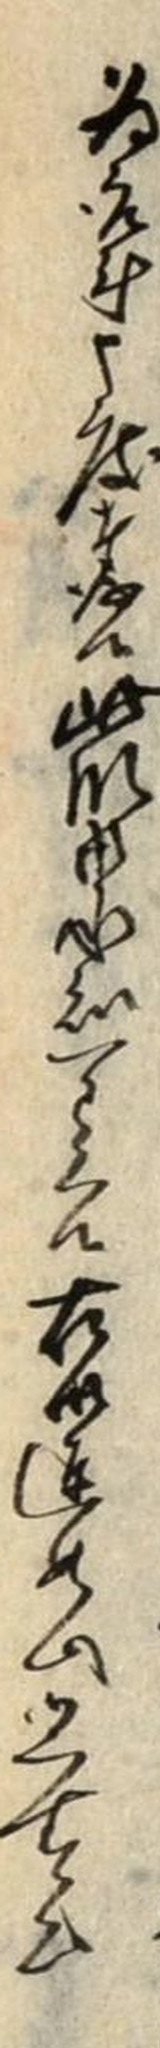為取斗申度奉存候此段御承知可被下候右御達如此御座候以上

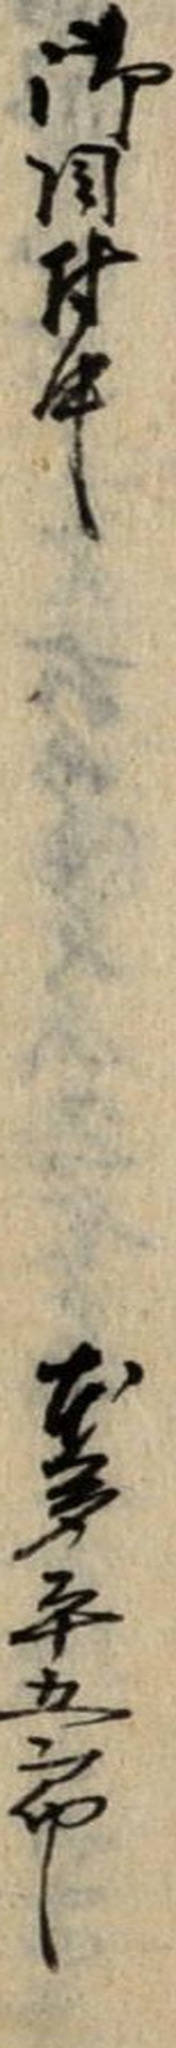御目付中本多平五郎
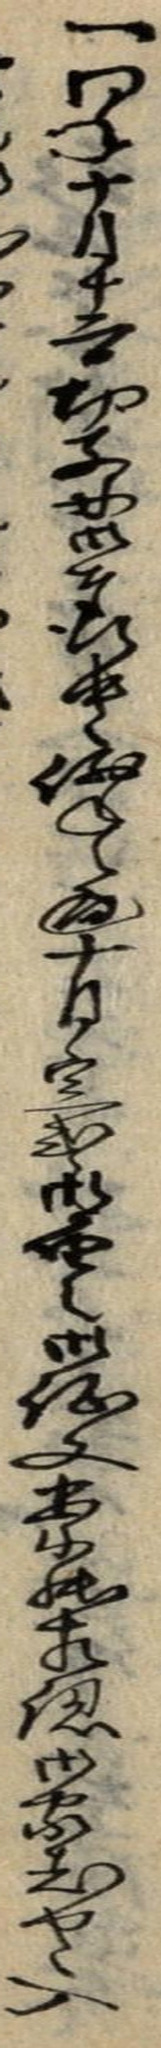一同年十月十二日切支丹御奉行中へ例年之通十月定式御届之御証文案紙相認御家老中へ入
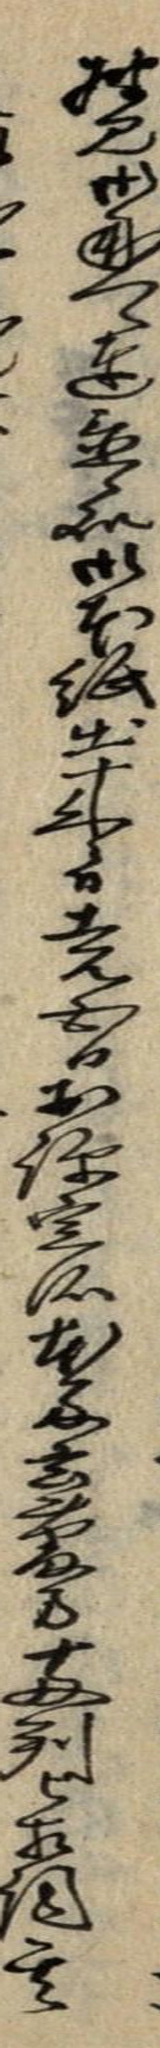披見御用人へ達置候処御本紙出来に付去ル五日於評定所本多玄蕃方両判被相調其
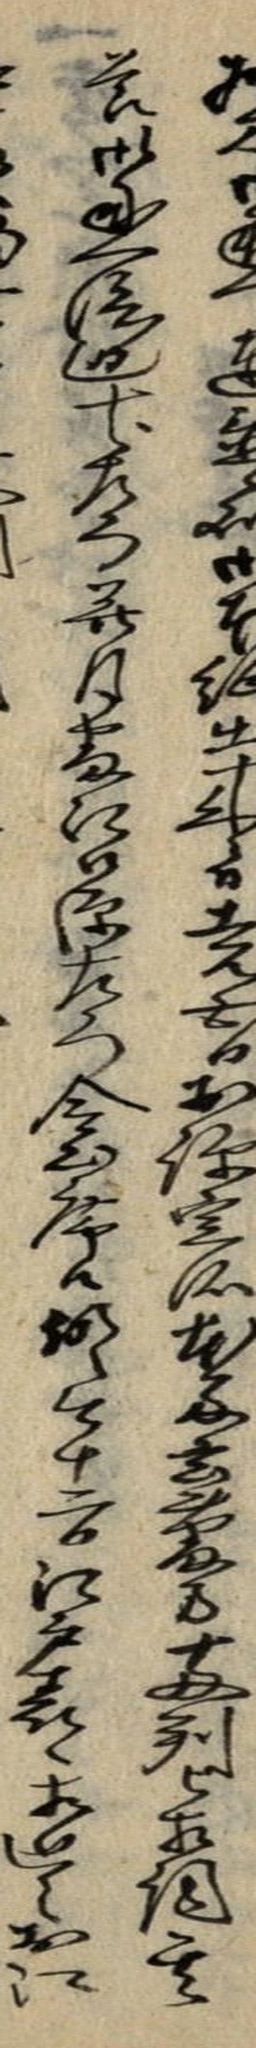節御用人渡辺十郎左衛門并月番江口源左衛門令出席候仍之今十二日江戸表へ相廻之於江
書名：御停止異変死失
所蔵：福井県文書館 Fukui Prefectural Archives
